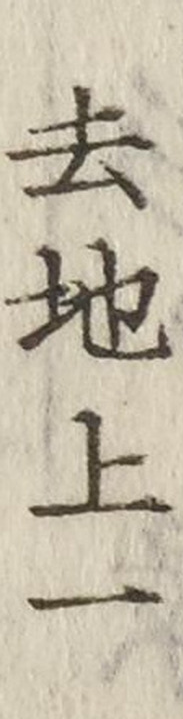去地上一
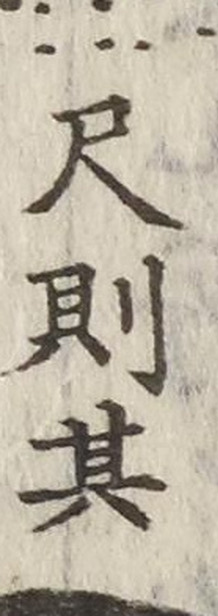尺則其
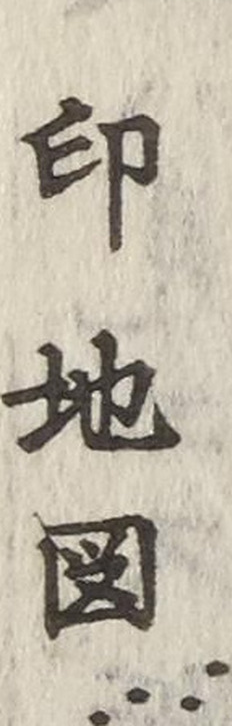印地図
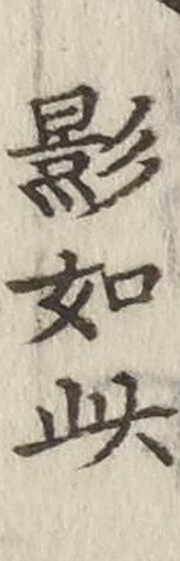影如此
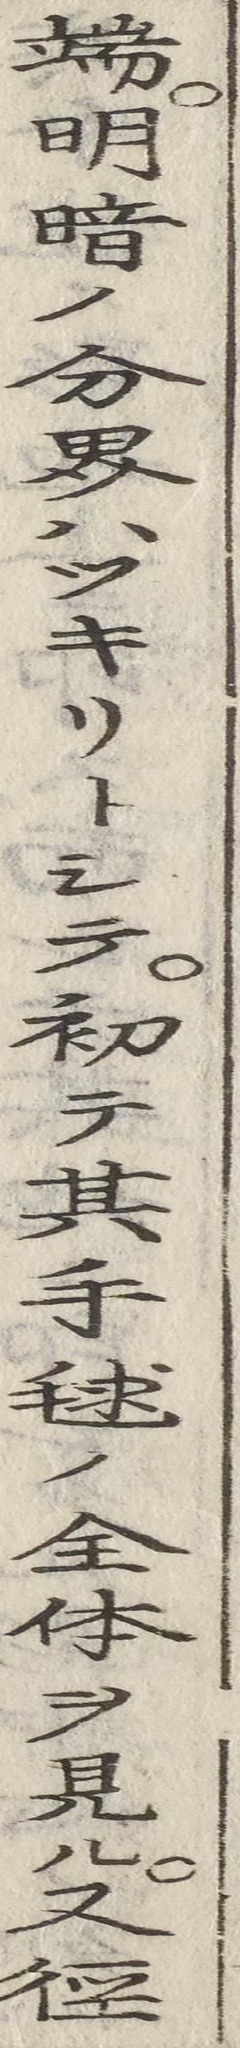端。明暗ノ分界ハツキリーシテ。初テ其手毬ノ全体ヲ見ル。又径
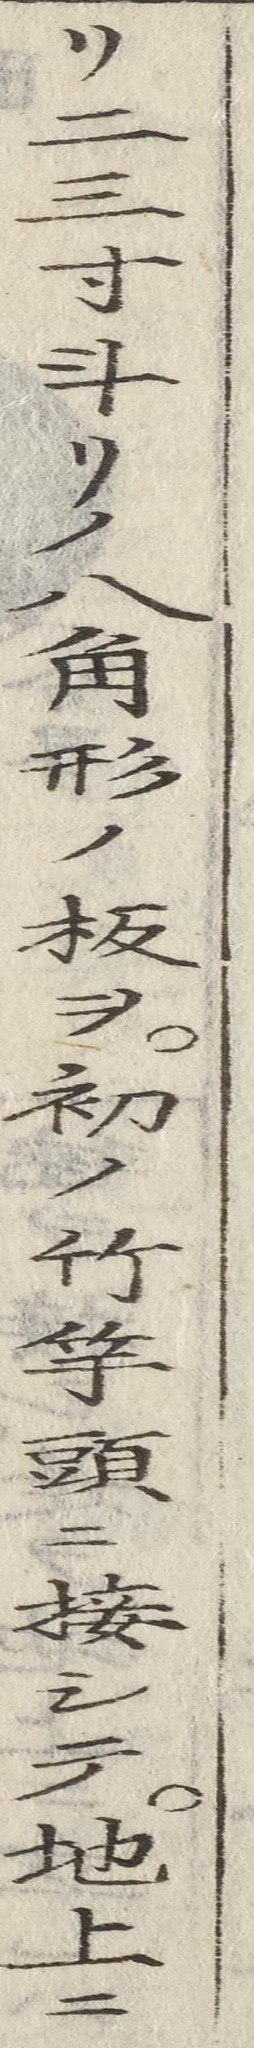リ二三寸斗リノ八角形ノ板ヲ。初ノ竹竿頭ニ接シテ。地上ニ
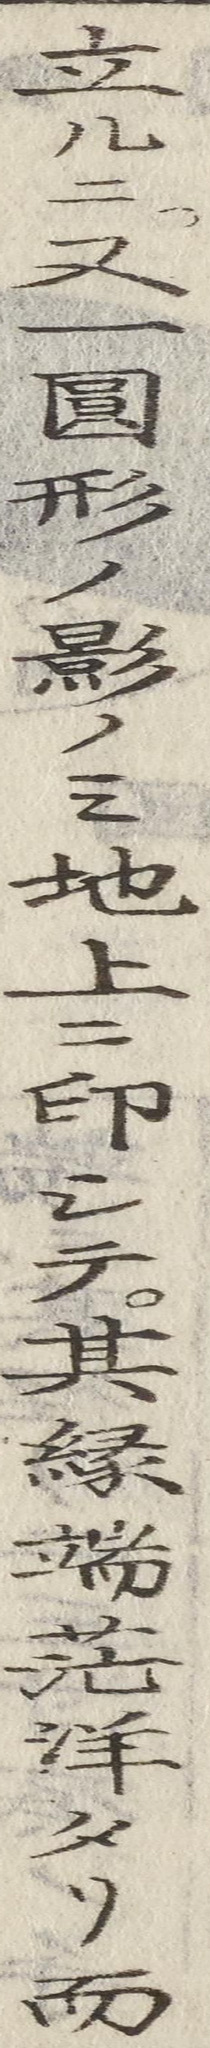立ルニ又一円形ノ影ノミ地上ニ印シテ。其縁端茫洋タリ而
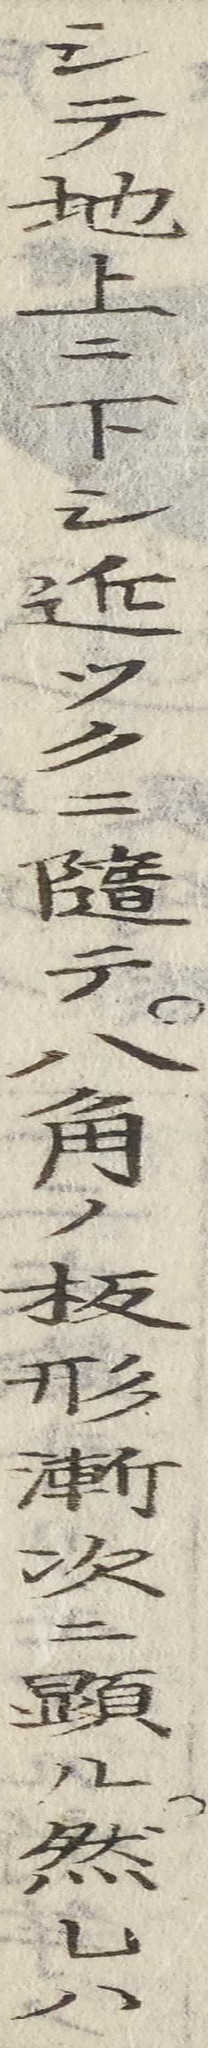シテ地上ニ下シ近ツクニ随テ。八角ノ板形漸次ニ顕ル。然レハ
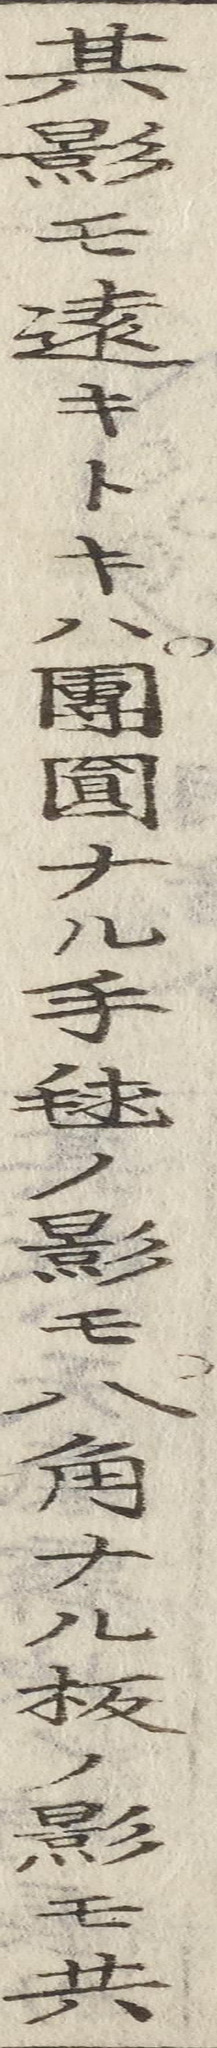其影モ遠キトキハ。団円ナル手毬ノ影モ八角ナル板ノ影モ共
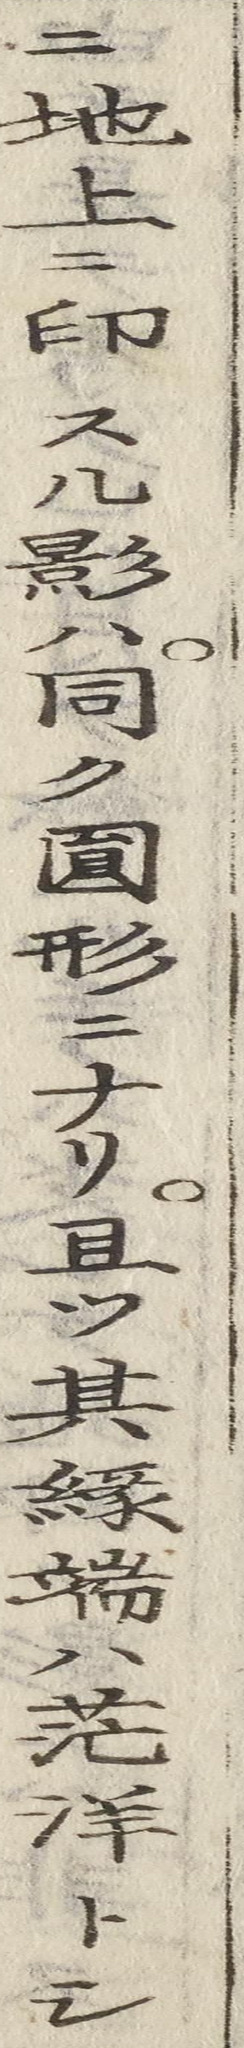ニ地上ニ印スル影ハ。同ク円形ニナリ。且ツ其縁端ハ茫洋トシ
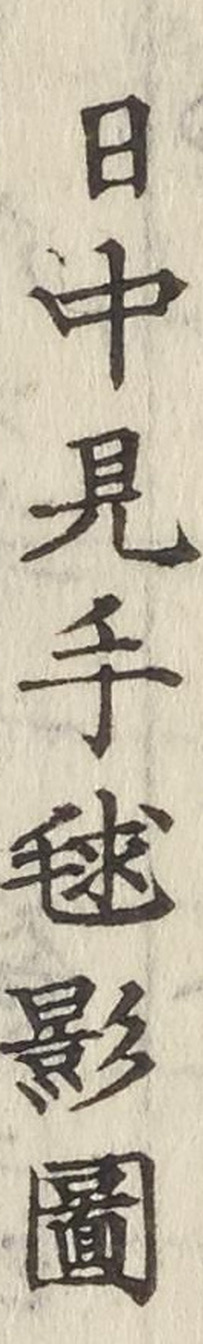日中見手毬影図
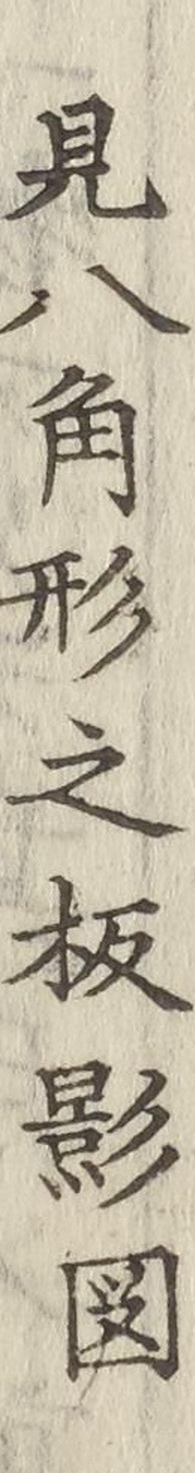見八角形之板影図
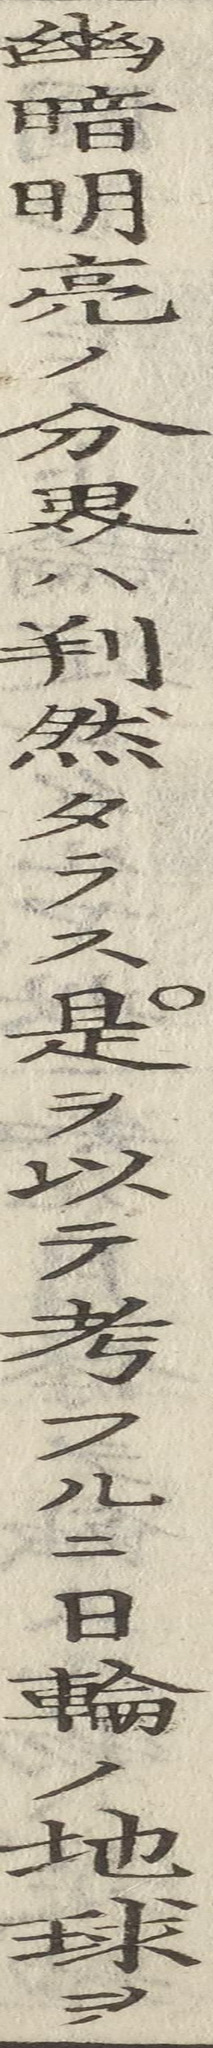幽暗明亮ノ分界ハ判然タラス。是ヲ以テ考フルニ日輪ノ地球ヲ
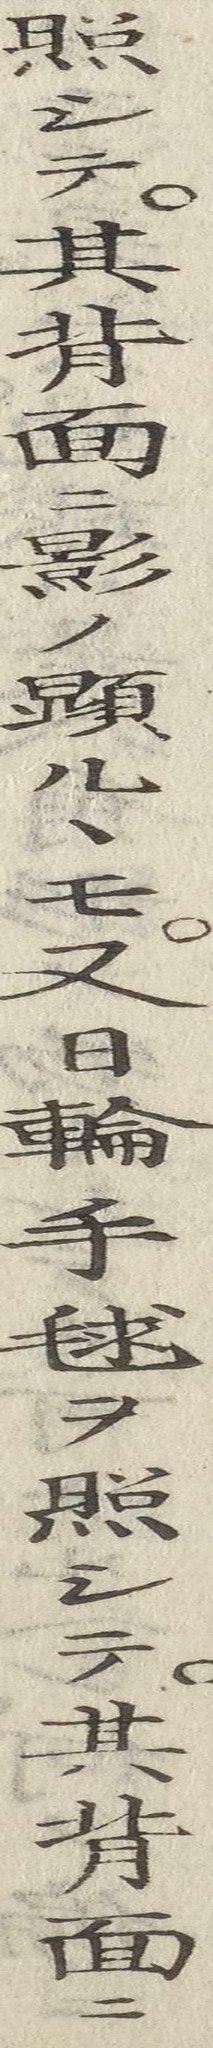照シテ。其背面ニ影ノ顯ルヽモ。又日輪手毬ヲ照シテ。其背面二
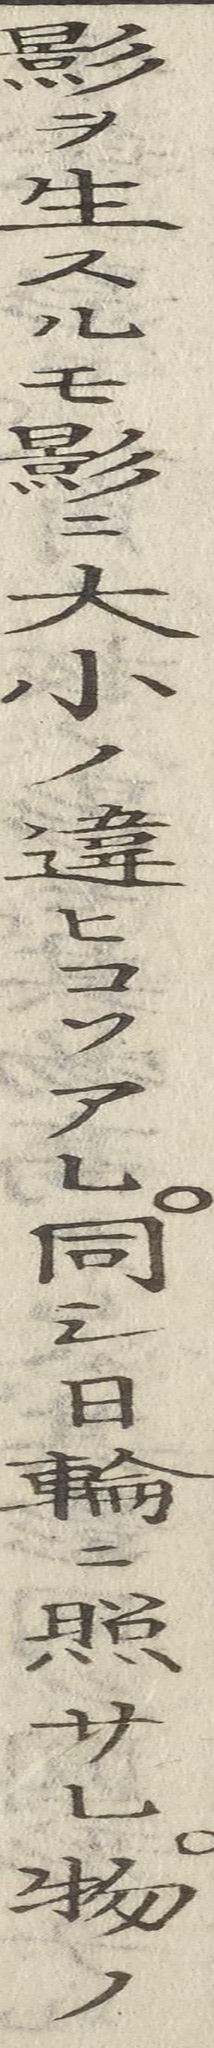影ヲ生スルモ影ニ大小ノ違ヒコソアレ。同シ日輪ニ照サレ。物ノ
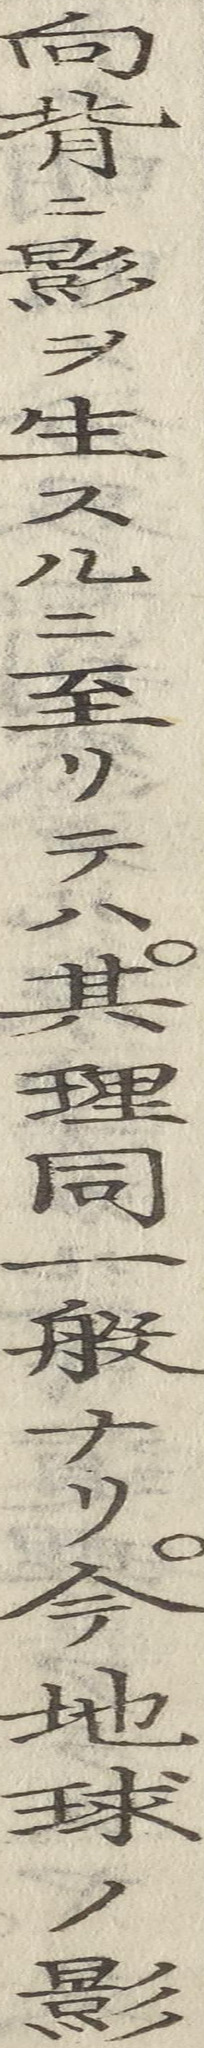向背ニ影ヲ生スルニ至リテハ。其理同一般ナリ。今地球ノ影
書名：護法新論　中
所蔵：東京大学地震研究所図書室 Earthquake Research Institute Library, The University of Tokyo, JAPAN
